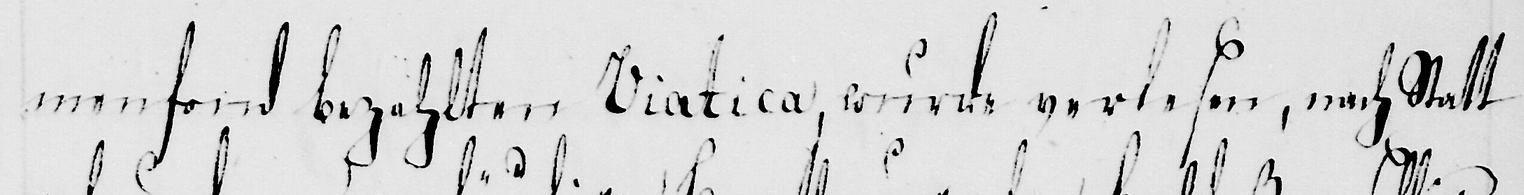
menfond bezahlten Viatica, wurde verlesen, nach Statt
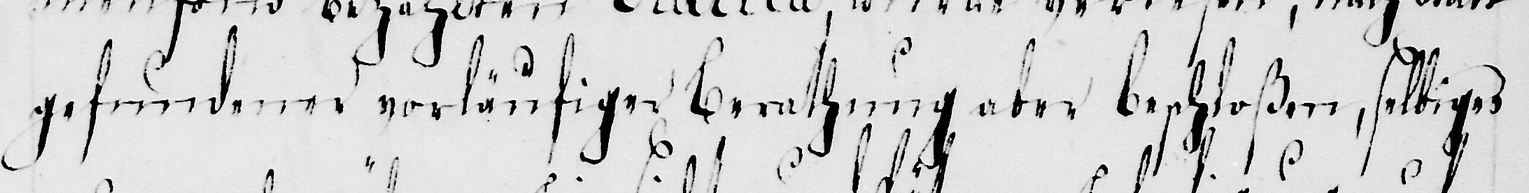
gefundener vorläufiger Berathung aber beschloßen, selbi¬
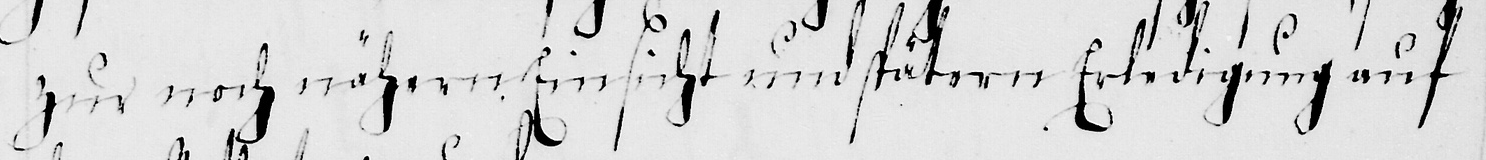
zur noch nähern Einsicht und spätern Erledigung auf
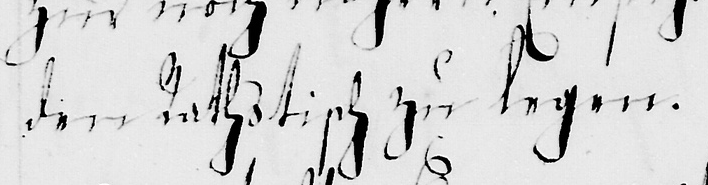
den Rathstisch zu legen.
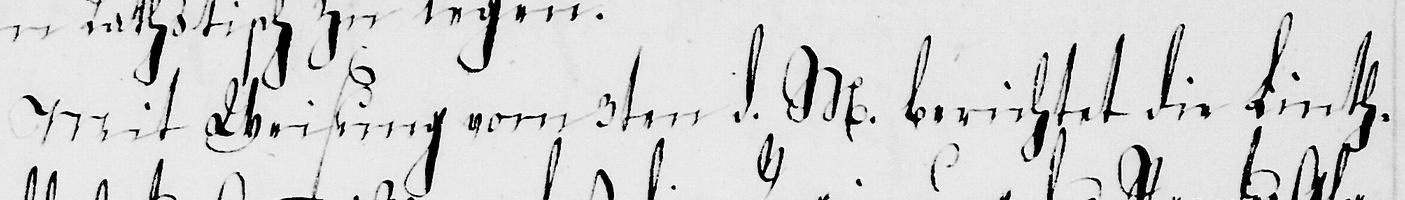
Mit Weisung vom 3ten d. M. berichtet die Linths¬
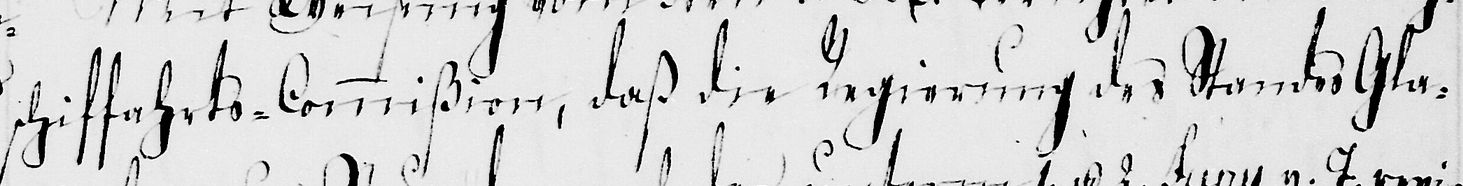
chiffahrts-Commißion, daß die Regierung des Standes Gla¬
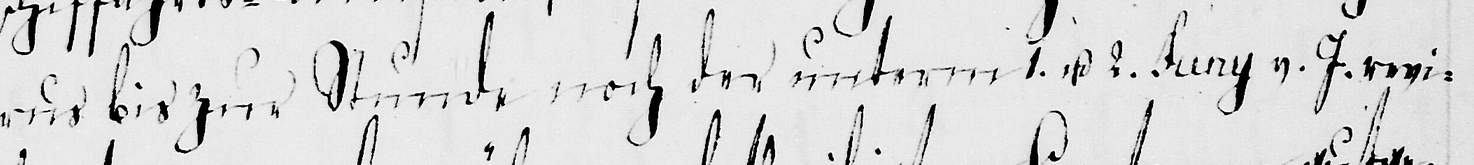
rus bis zur Stunde noch der unterm 1. & 2. Juny v. J. revi¬
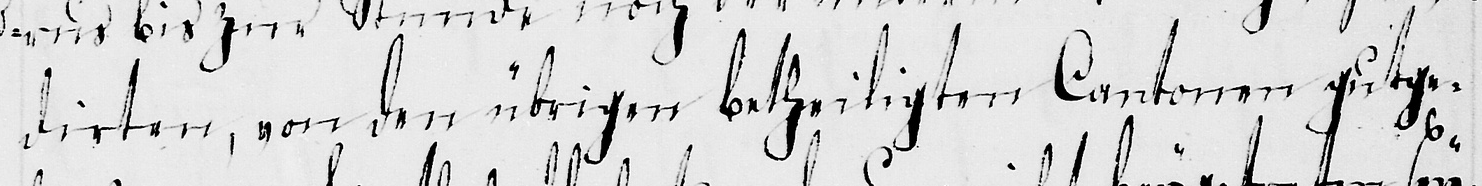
dirten, von den übrigen betheiligten Cantonen gutge¬
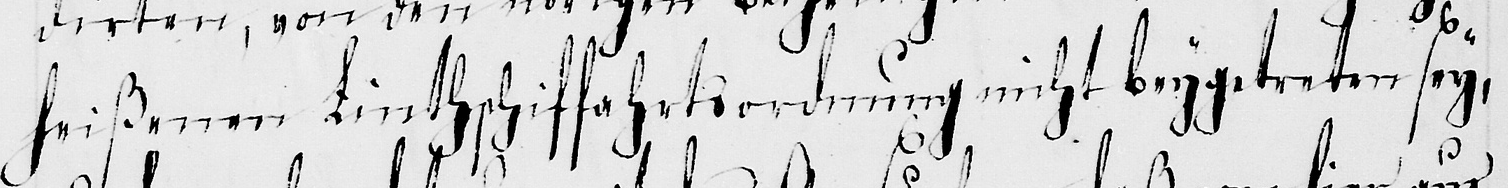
heißenen Linthschiffahrtsordnung nicht beygetreten sey,
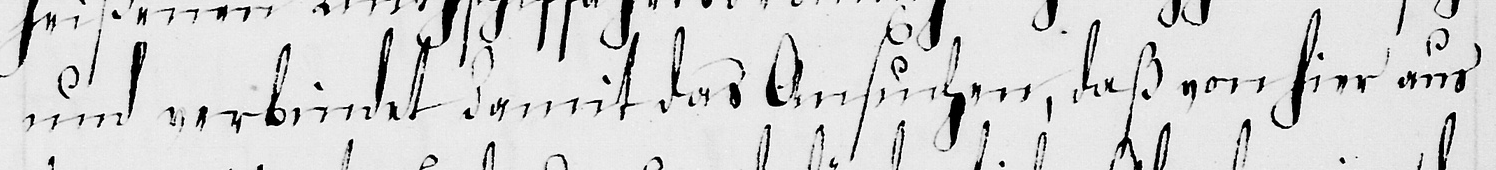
und verbindet damit das Ansuchen, daß von hier aus
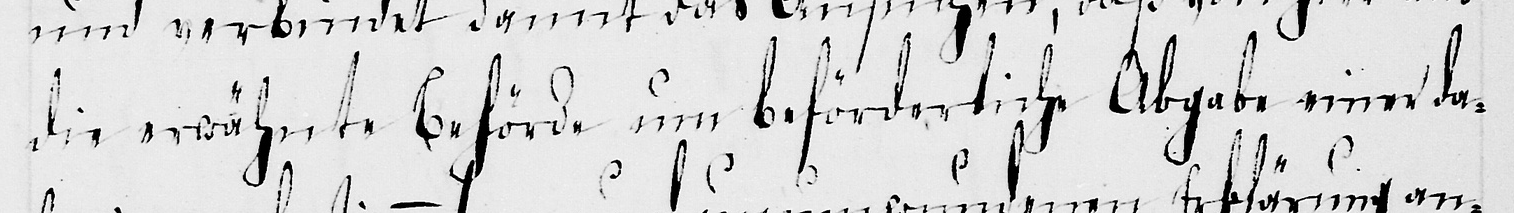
die erwähnte Behörde um beförderliche Abgabe einer da¬
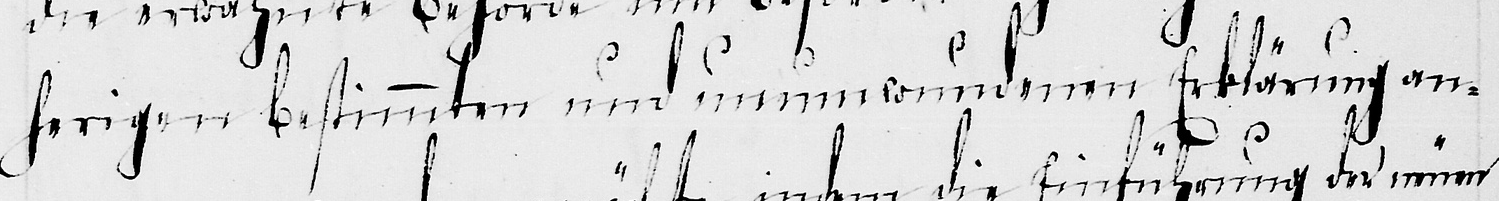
herigen bestimmten und unumwundenen Erklärung an¬
